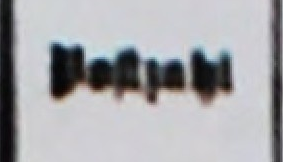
Postzahl
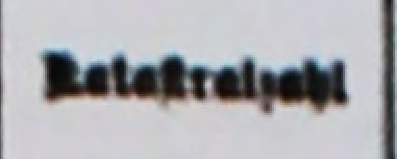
Katastralzahl
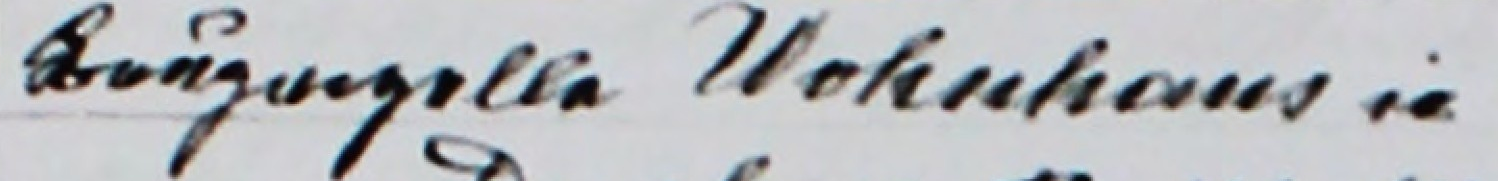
Bauparzelle Wohnhaus in
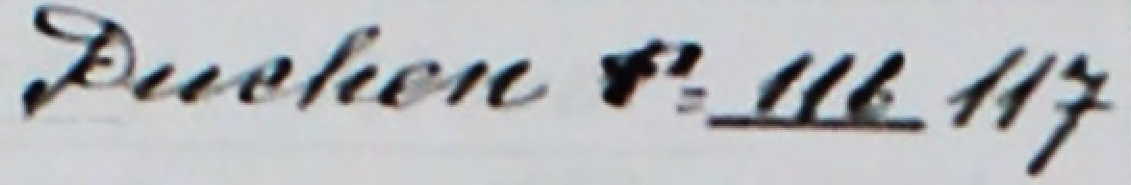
Puchen No 116 117
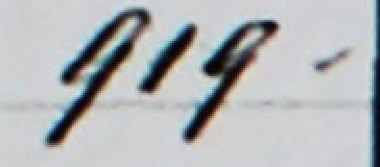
919
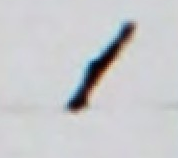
1
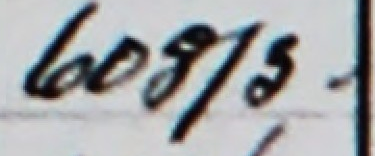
608/3
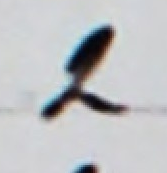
2
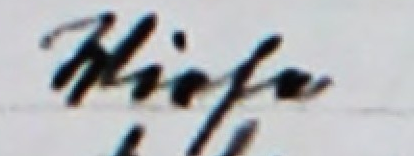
Wiese
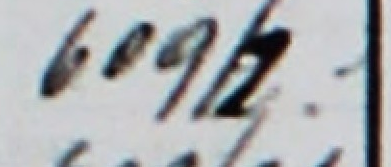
609/2
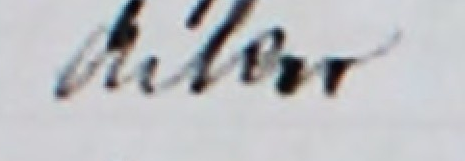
Acker
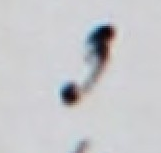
3
